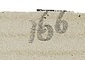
Januar
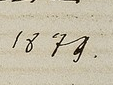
1879.
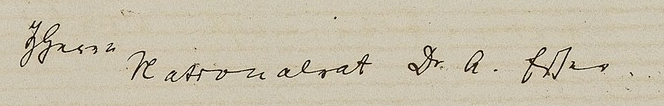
HHerrn Nationalrat Dr. A. Escher.
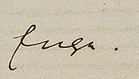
Enge.
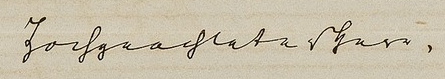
Hochgeachteter Herr,
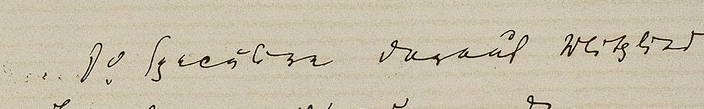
Ich speculire darauf Mitglied
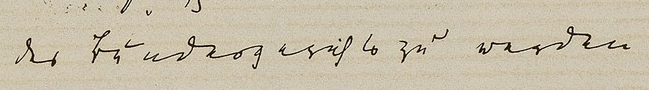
des Bundesgerichts zu werden.
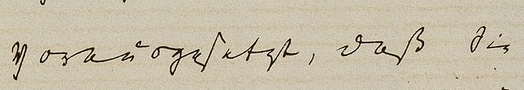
Vorausgesetzt, daß Sie
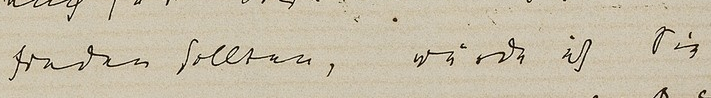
finden sollten, würde ich Sie
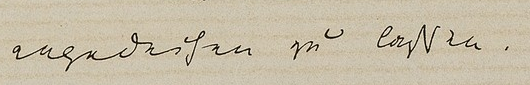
angedeihen zu lassen.
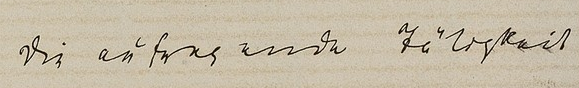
Die aufregende Tätigkeit
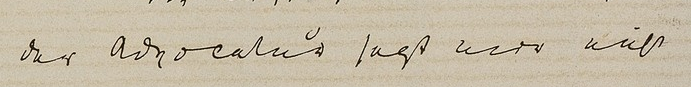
der Advocatur sagt mir nicht
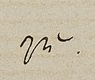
zu.
